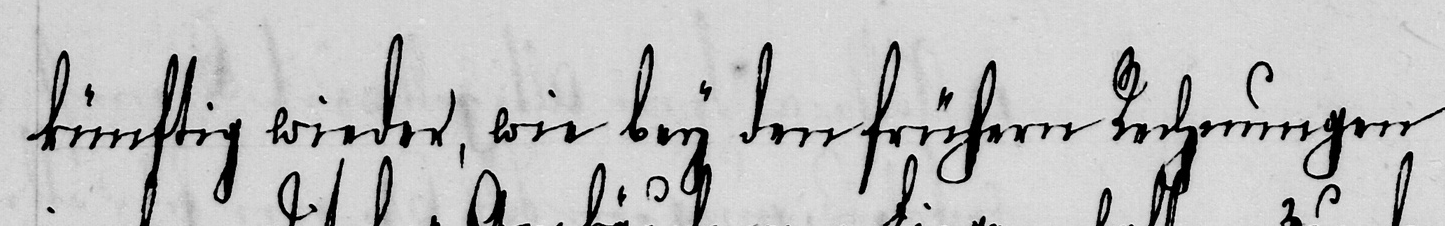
künftig wieder, wie bey den frühern Rechnungen
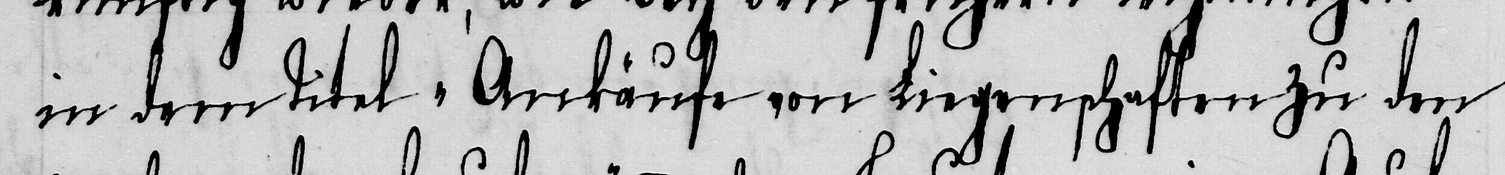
in dem Titel „Ankäufe von Liegenschaften zu den
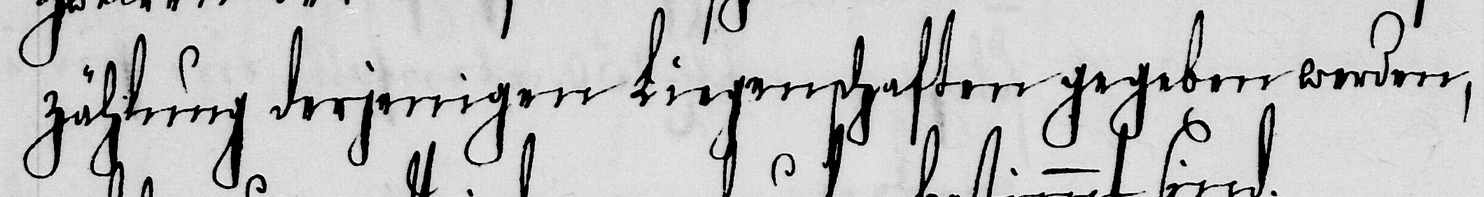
zählung derjenigen Liegenschaften gegeben werden,
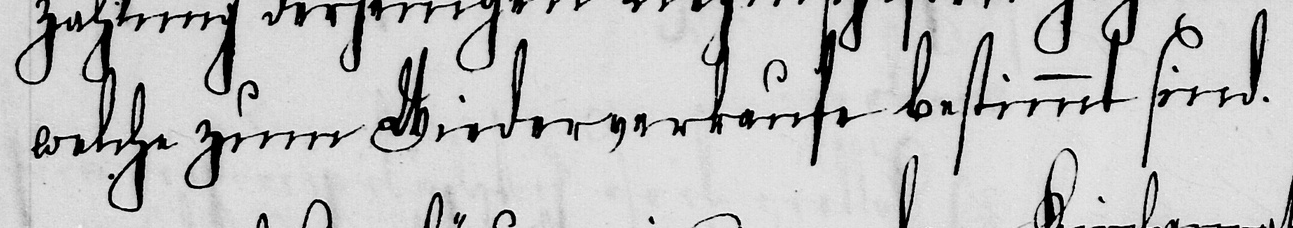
welche zum Wiederverkaufe bestimmt sind.
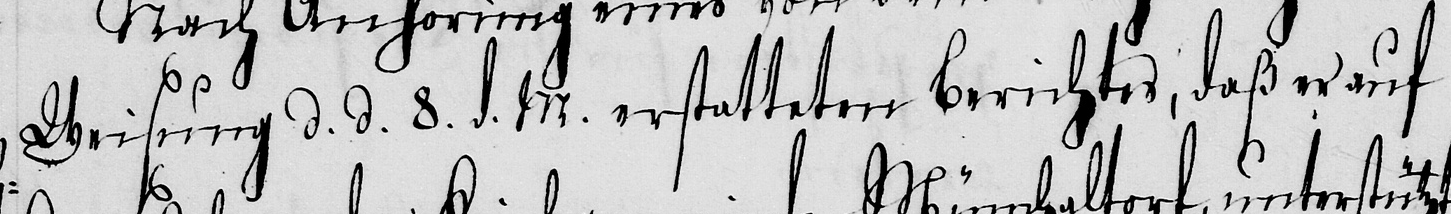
Weisung d. d. 8. d. M. erstatteten Berichtes, daß er auf
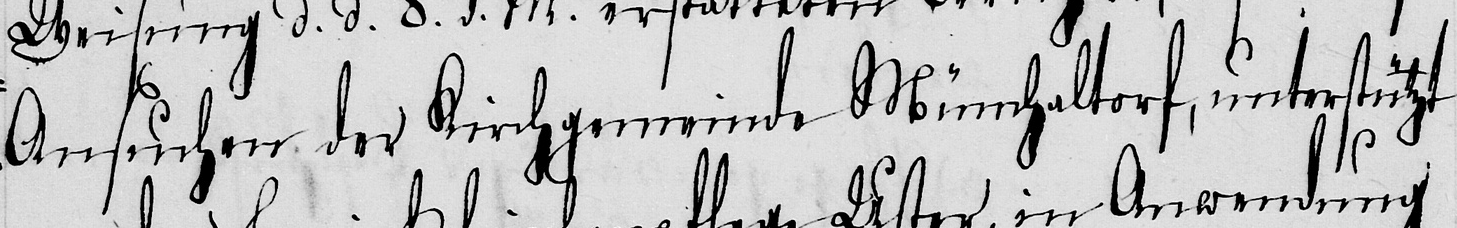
Ansuchen der Kirchgemeinde Münchaltorf, unterstüt¬
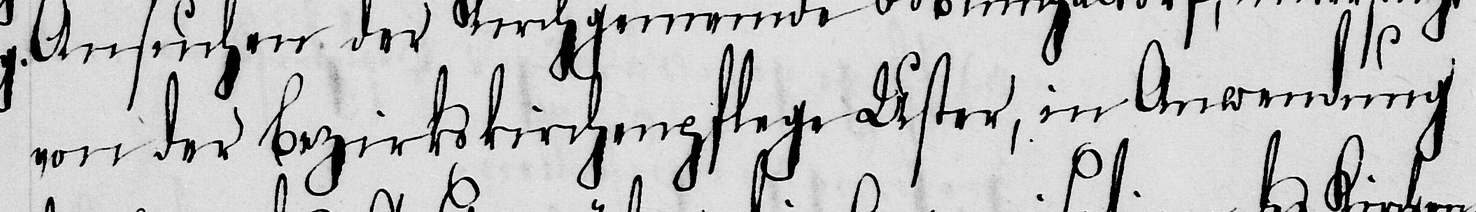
von der Bezirkskirchenpflege Uster, in Anwendung
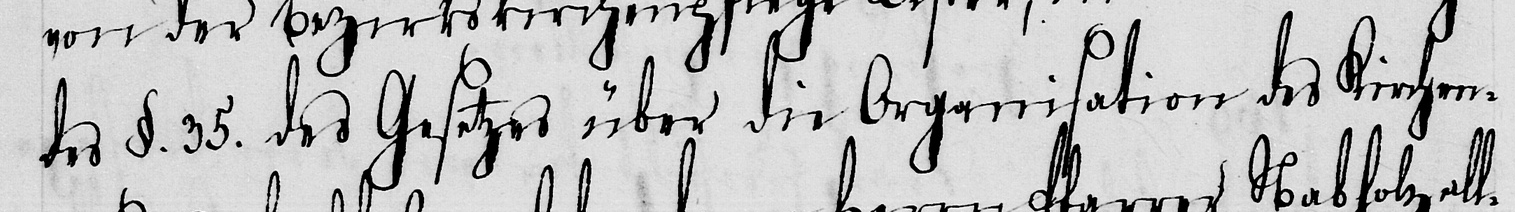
des §. 35. des Gesetzes über die Organisation des Kirchen¬
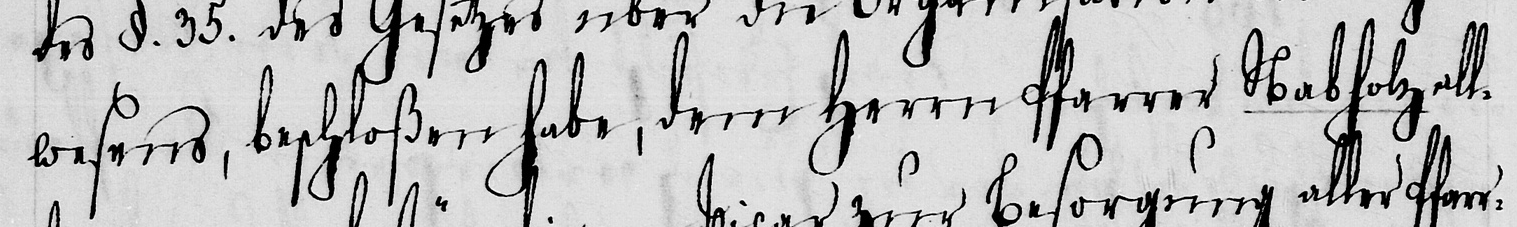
wesens, beschloßen habe, dem Herrn Pfarrer Nabholz al¬
